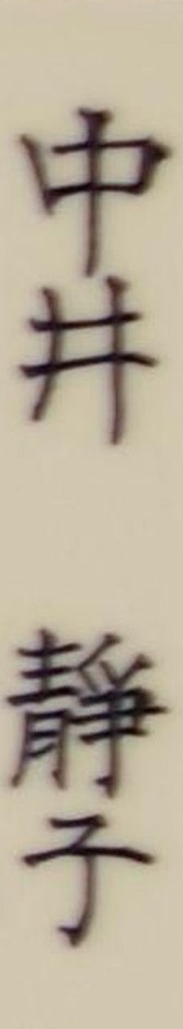中井静子
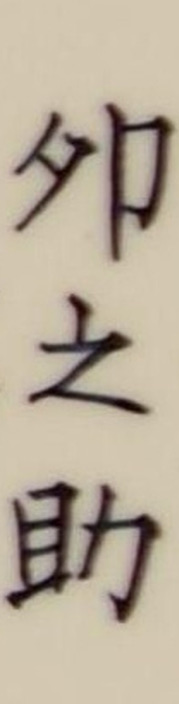卯之助
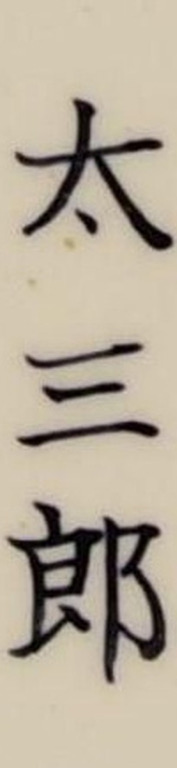太三郎
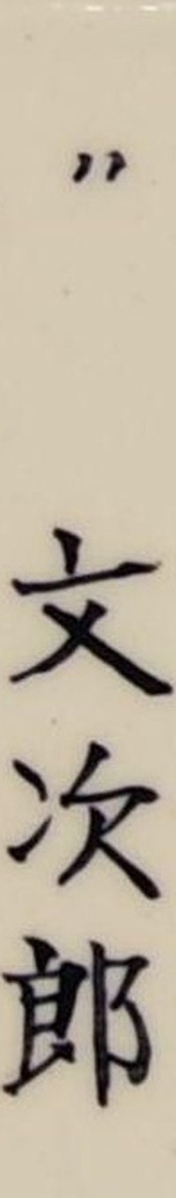文次郎
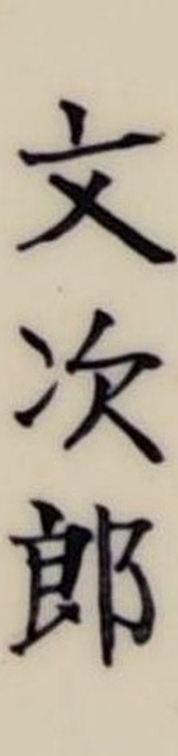文次郎
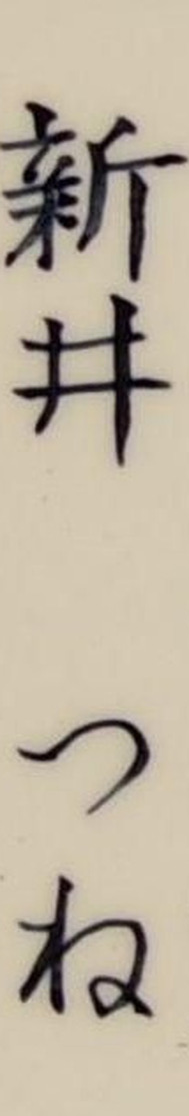新井つね
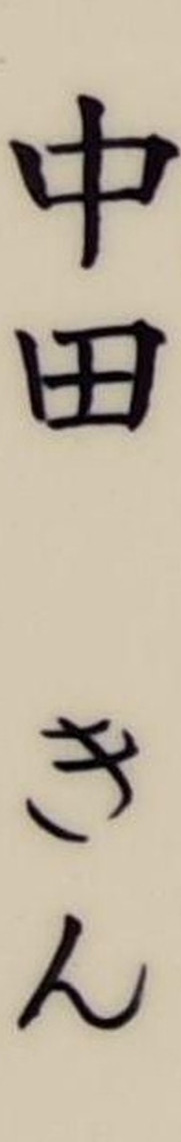中田きん
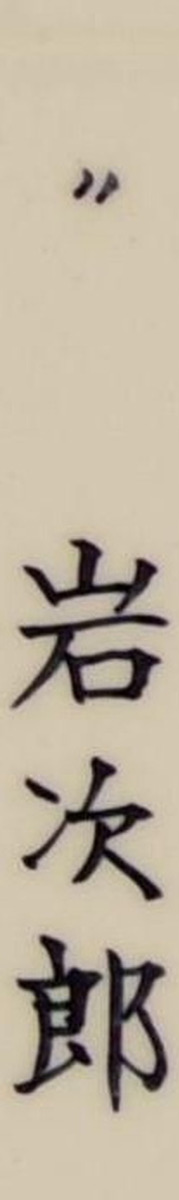岩次郎
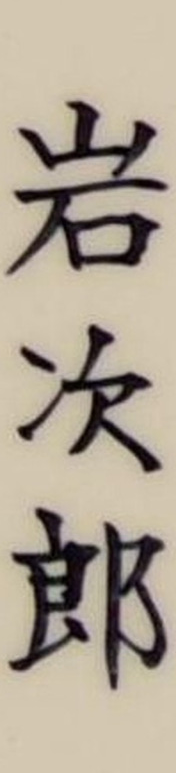岩次郎
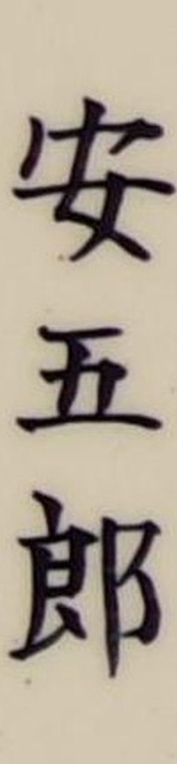安五郎
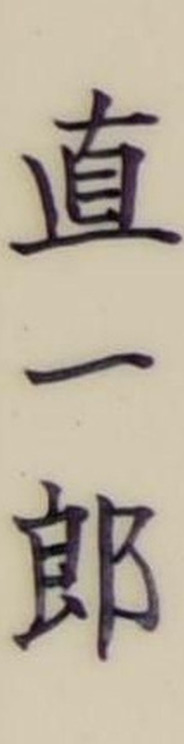直一郎

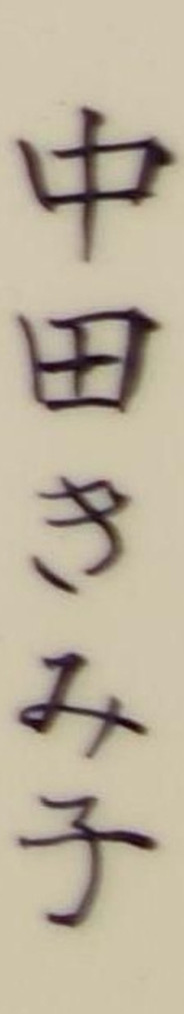中田きみ子
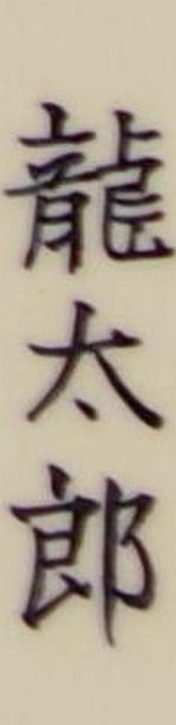龍太郎
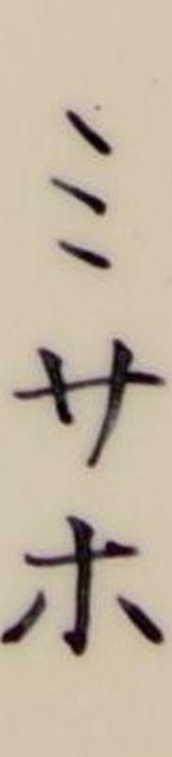ミサホ
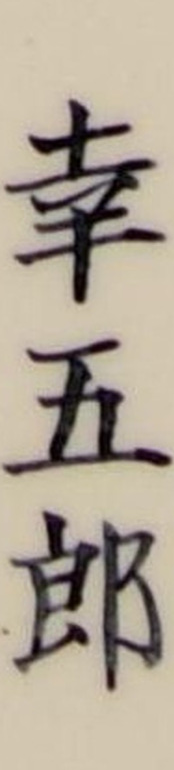幸五郎
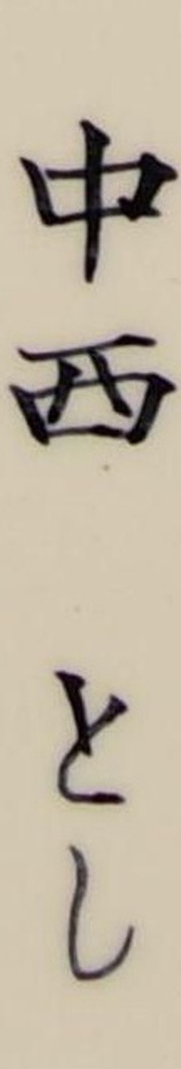中西とし
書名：A~D
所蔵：koyasan kongobuji
